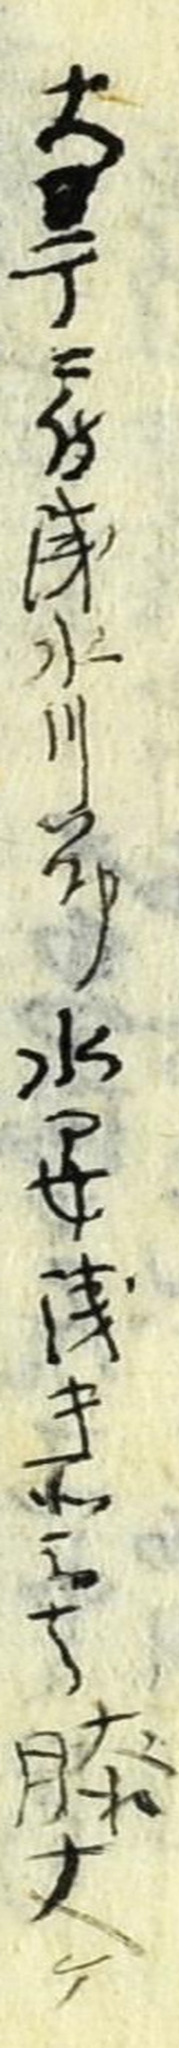大旱ニ付浅水川筋水アサ浅キ所二而は膝丈ケ
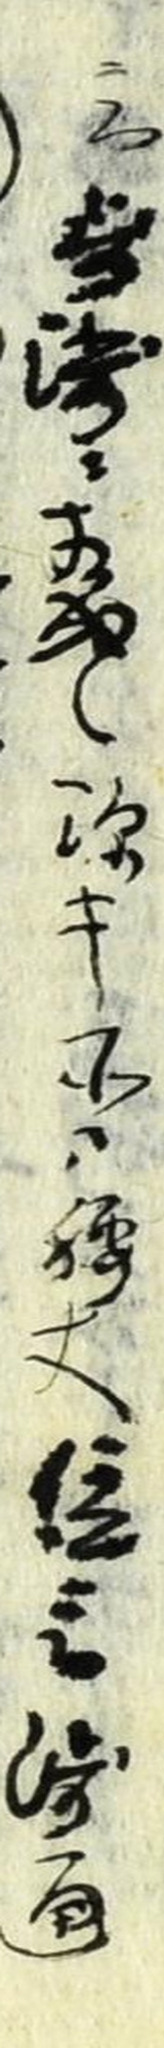ニ而歩渉に相成候深キ所ハ腰丈位ニ而渉通
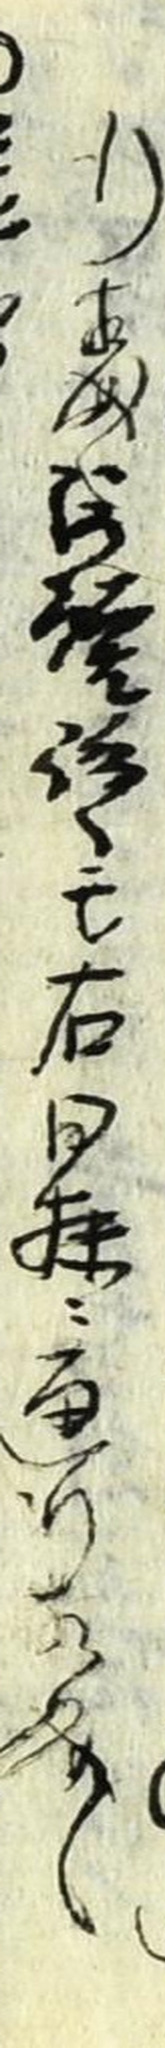行相成河饒島へモ右同様ニ通行相成候
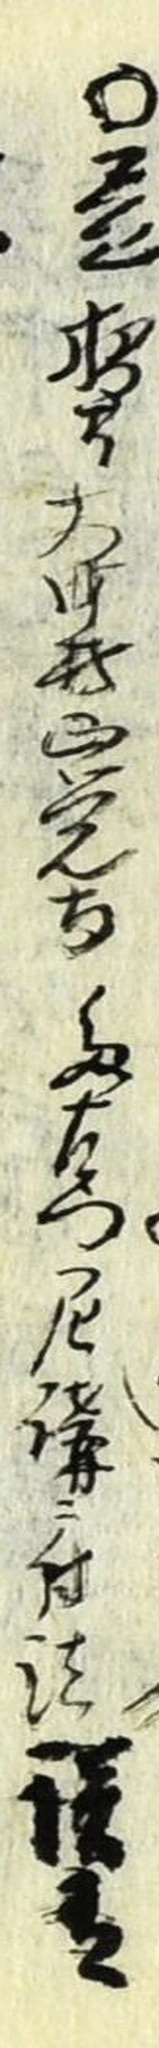○昼夜共大町村正覚寺多左衛門尼講ニ付法談有
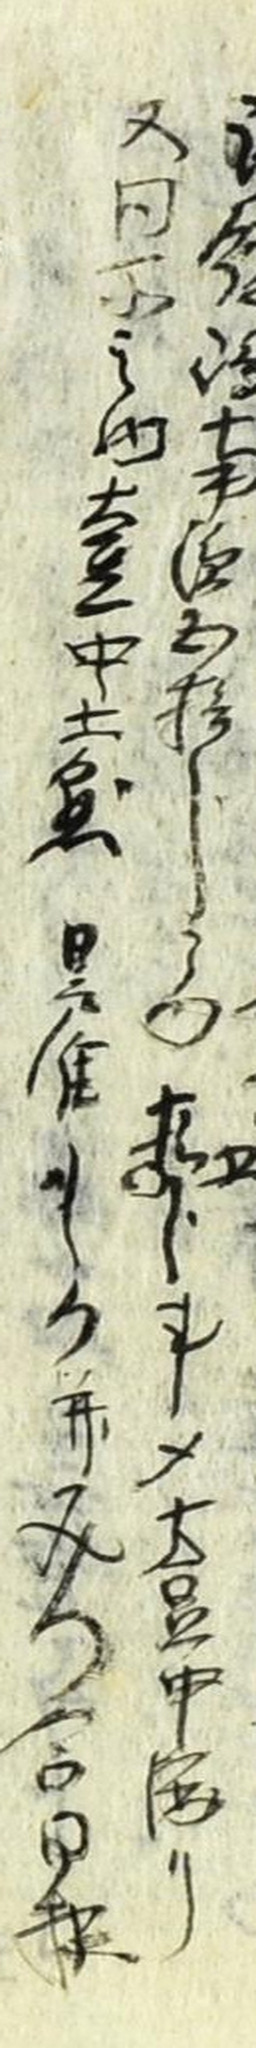又同所之内大豆中土懸日雇しか幷みつ合同様
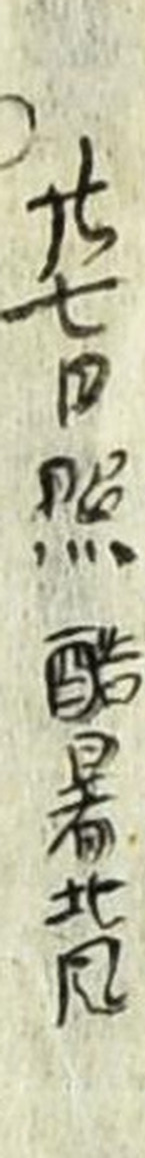○廿七日照酷暑北風
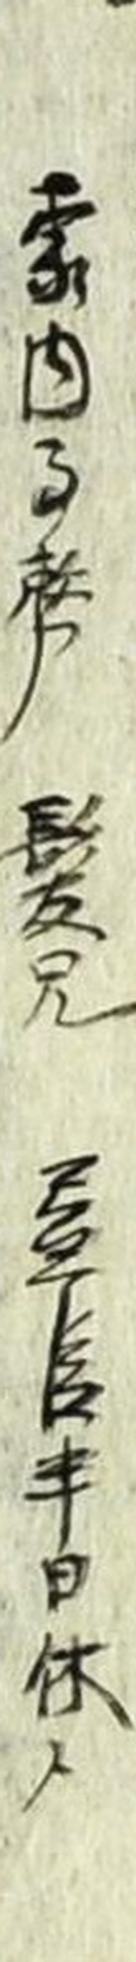家内事務髪兄昼後半日休候
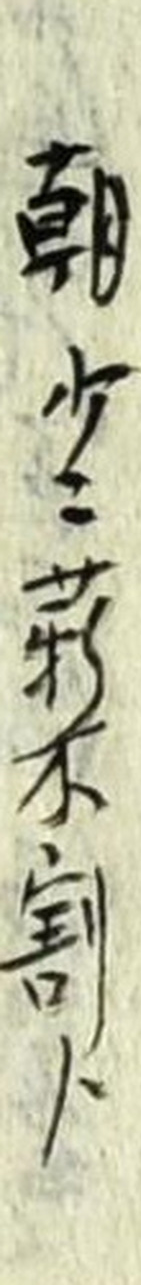朝少々薪木割候
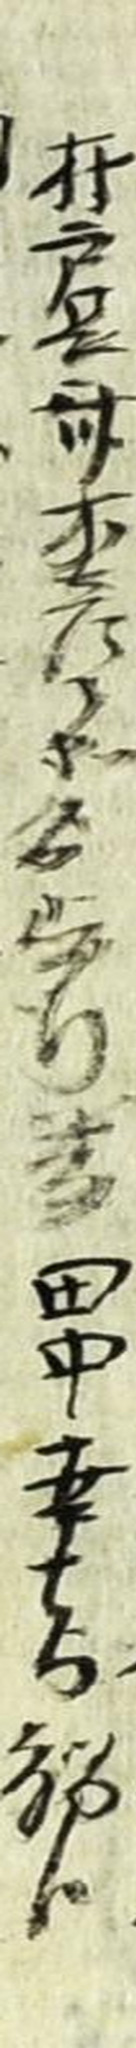村戸長斎木彦兵衛ゟ歩行番田中幸右衛門触候
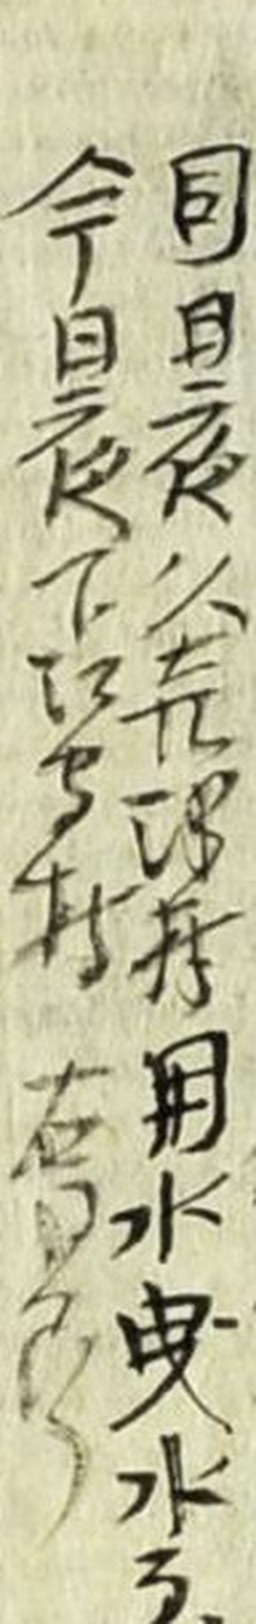今日夜下江守村右同断
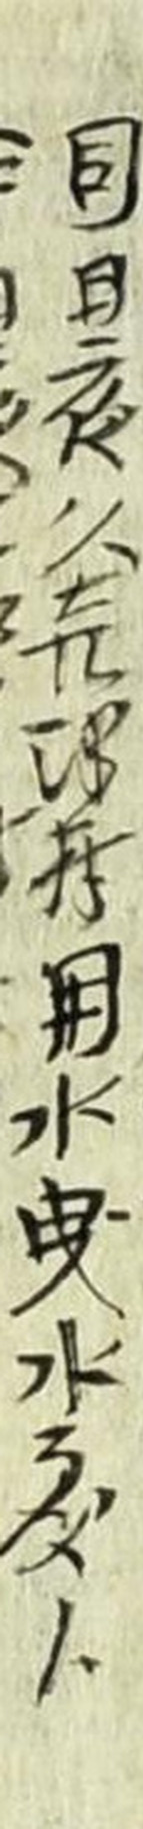同日夜久喜津用水曳水致候
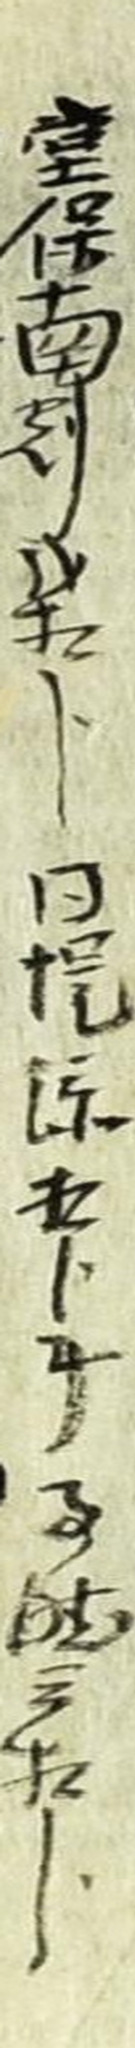堂保南割弐拾歩同堤添拾歩計事畔三拾歩
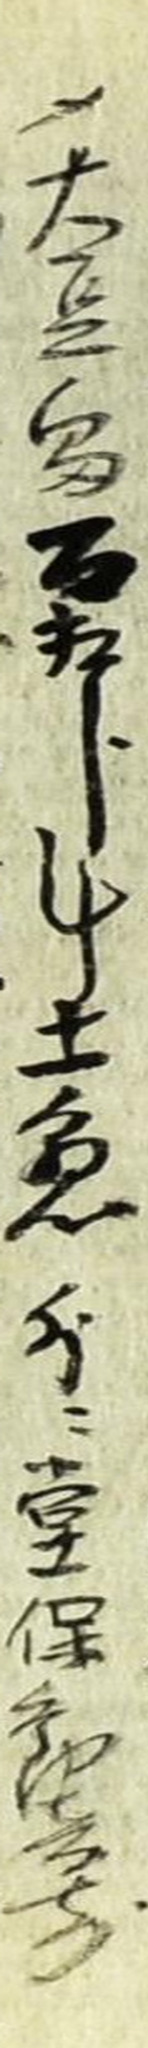〆大豆畠百拾歩計土懸外ニ同保勧音前
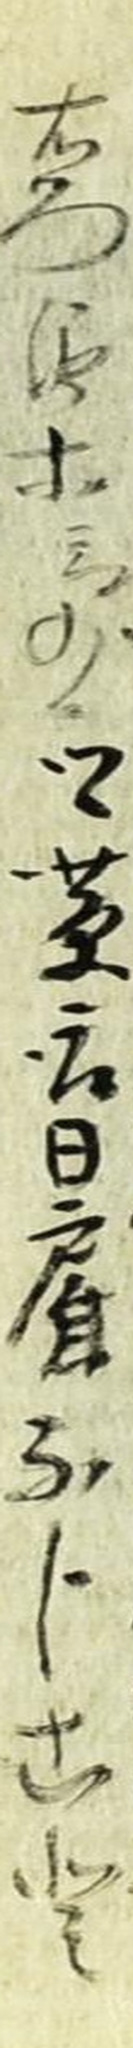右衛門浜等ニ而少々ツヽ草取日雇ふじこと
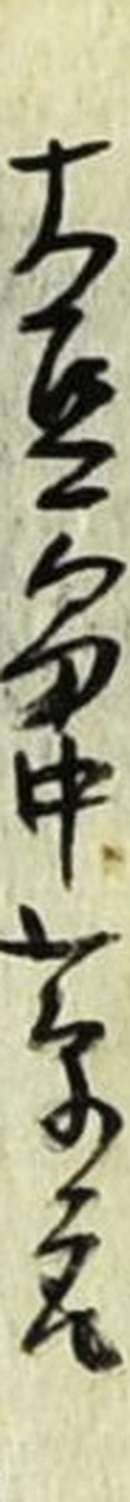大豆畠中草取
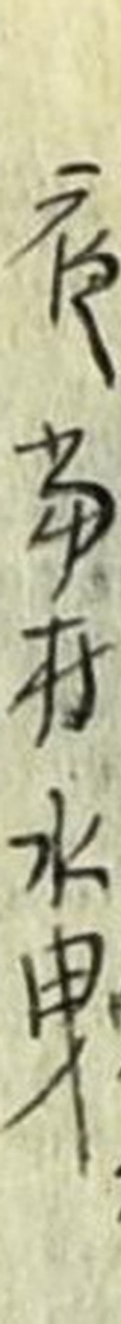夜当村水曳
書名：（日記）
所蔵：福井県文書館 Fukui Prefectural Archives
